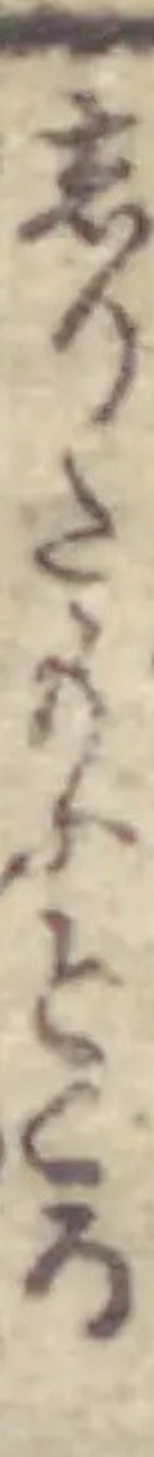しりたもふところ
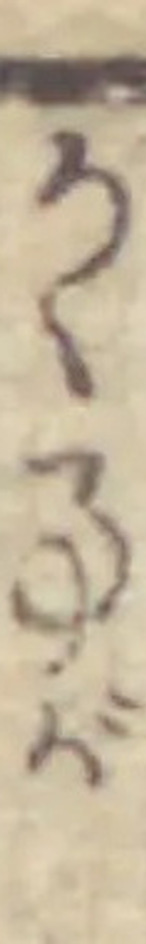かく事が
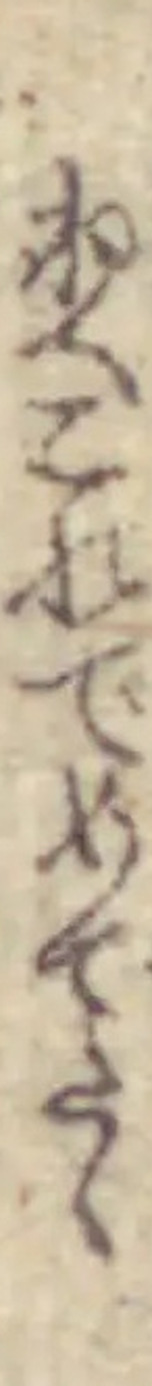ねへこれでめでたく
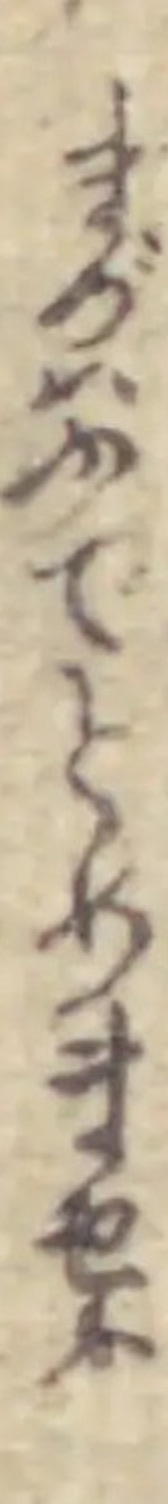まづはふでとめませふ
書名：雨宮風宮出儘略縁記 3巻
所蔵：国立国会図書館 National Diet Library, JAPAN
